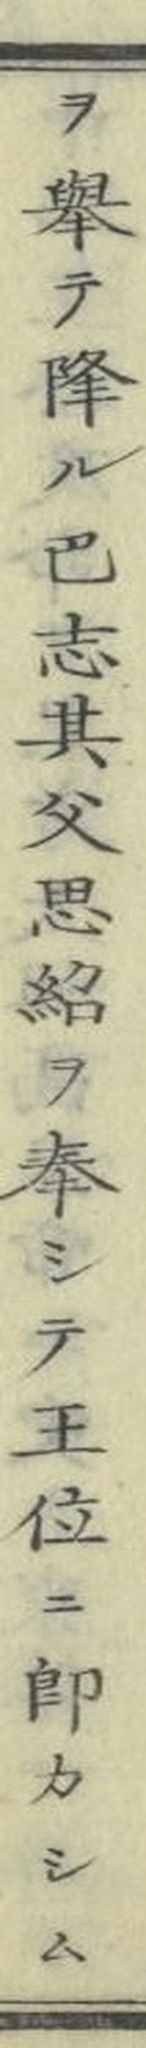ヲ舉テ降ル巴志其父思紹ヲ奉シテ王位ニ即カシム
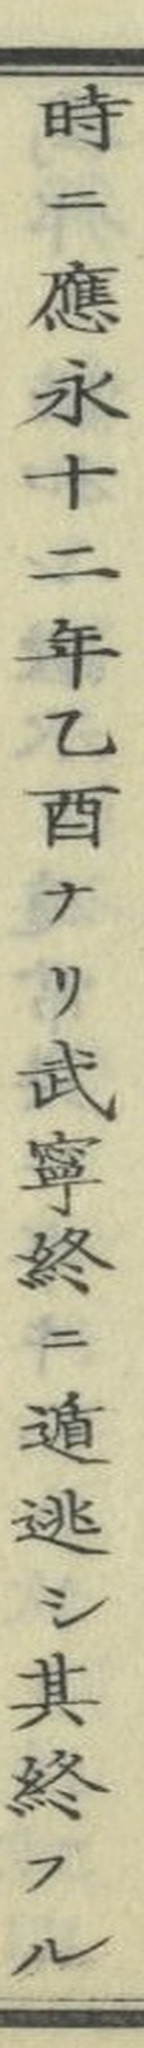時ニ應永十二年乙酉ナリ武寧終ニ遁逃シ其終フル
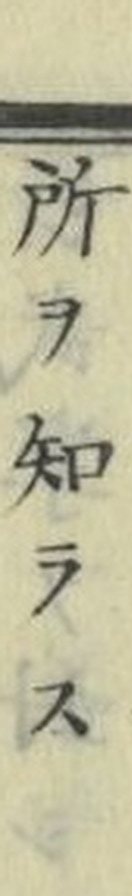所ヲ知ラス
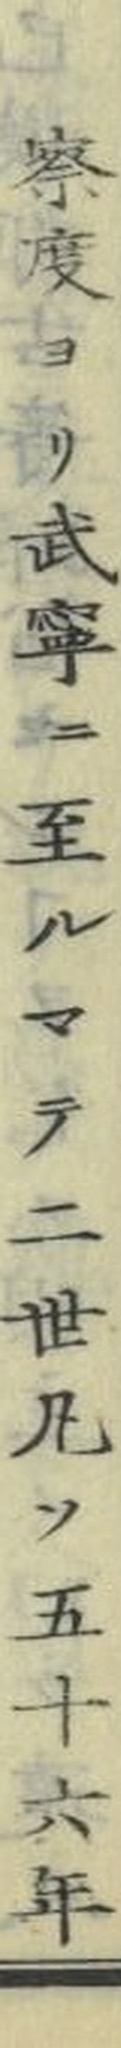察度ヨリ武寧ニ至ルマテ二世凡ソ五十六年
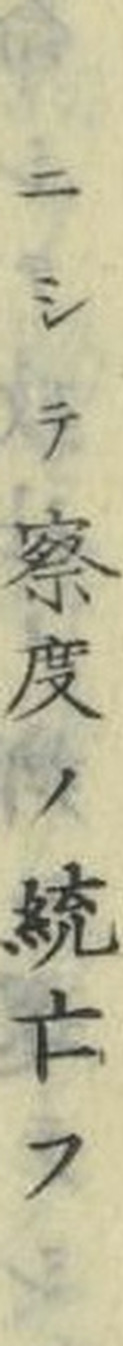ニシテ察度ノ統亡フ
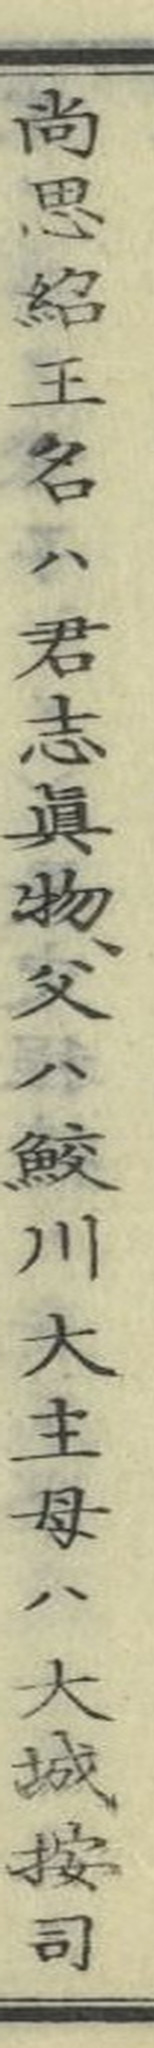尚思紹王名ハ君志眞物、父ハ鮫川大主母ハ大城按司
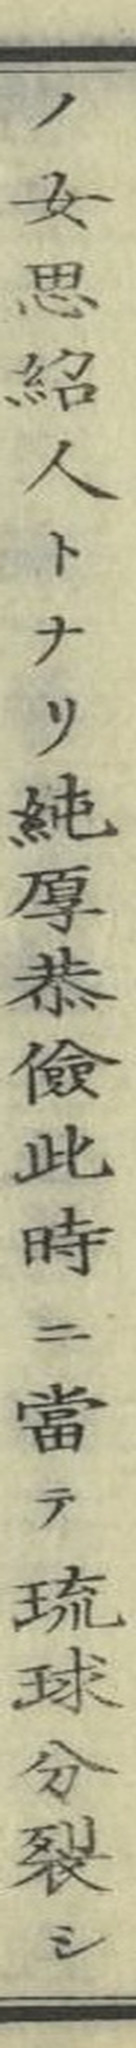ノ女思紹人トナリ純厚恭儉此時ニ當テ琉球分裂シ
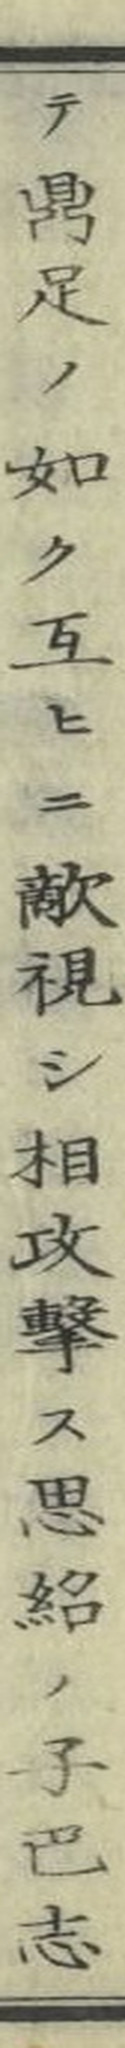テ足ノ如ク互ヒニ歒視シ相攻擊ス思紹ノ子巴志
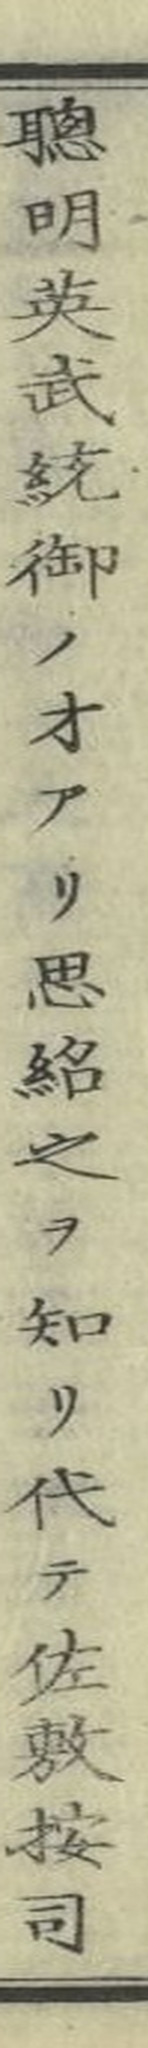聰明英武統御ノ才アリ思紹之ヲ知リ代テ佐數按司
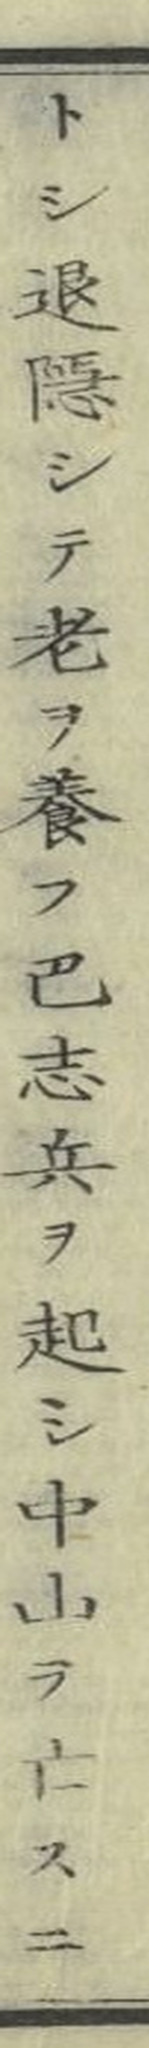トシ退隠シテ老ヲ養フ巴志兵ヲ起シ中山ヲ亡スニ
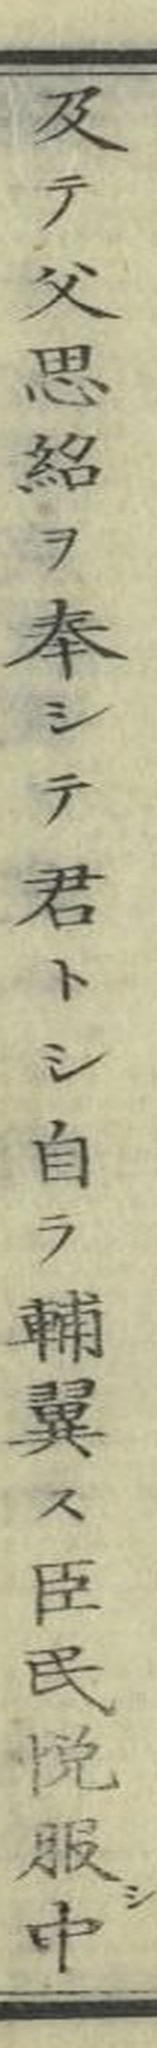及テ父思紹ヲ奉シテ君トシ自ラ輔翼ス臣民悦服中
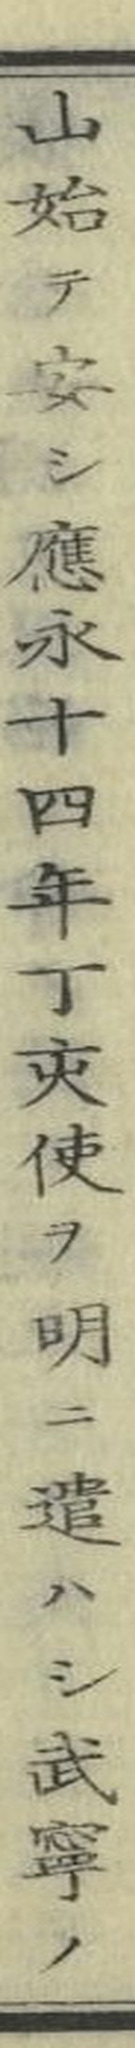山始テ安シ應永十四年丁亥使ヲ明ニ遣ハシ武寧ノ

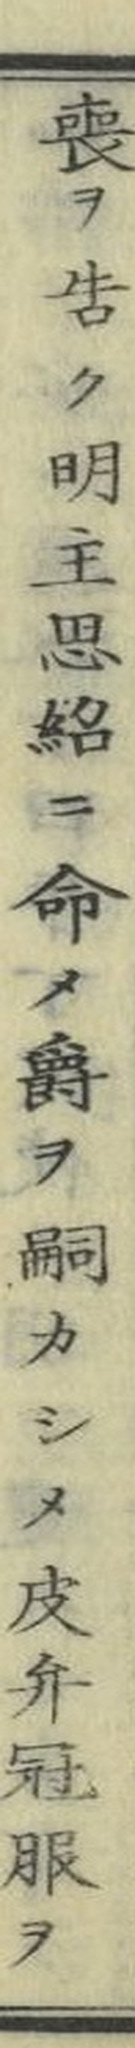喪ヲ告ク明主思紹ニ命シテ爵ヲ嗣カシメ皮弁冠服ヲ
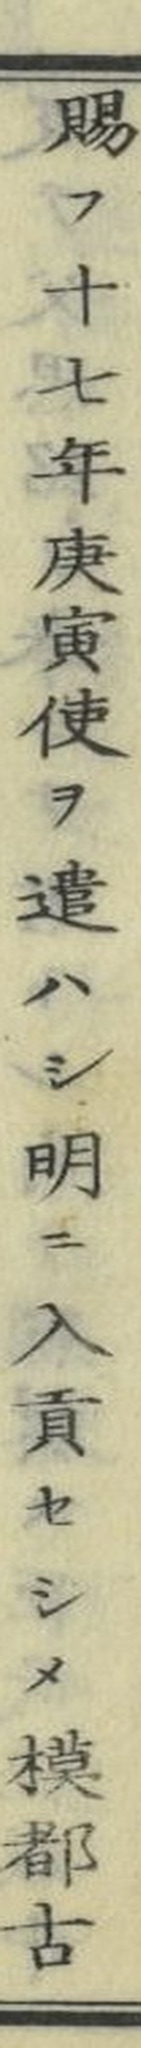賜フ十七年庚寅使ヲ遣ハシ明ニ入貢セシメ模都古
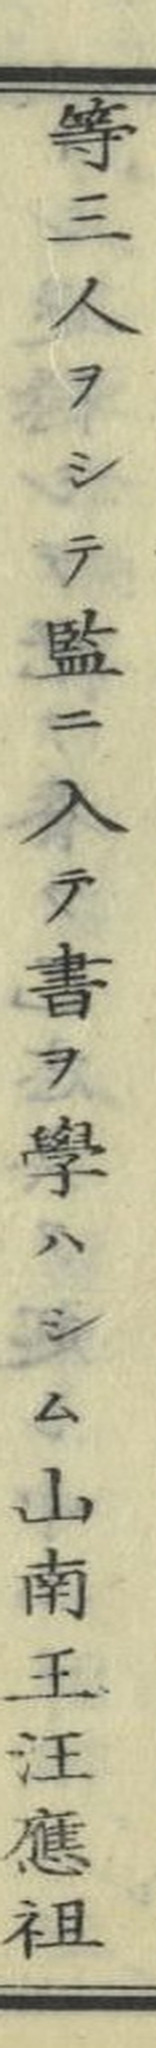等三人ヲシテ監ニ入テ書ヲ學ハシム山南王汪應祖
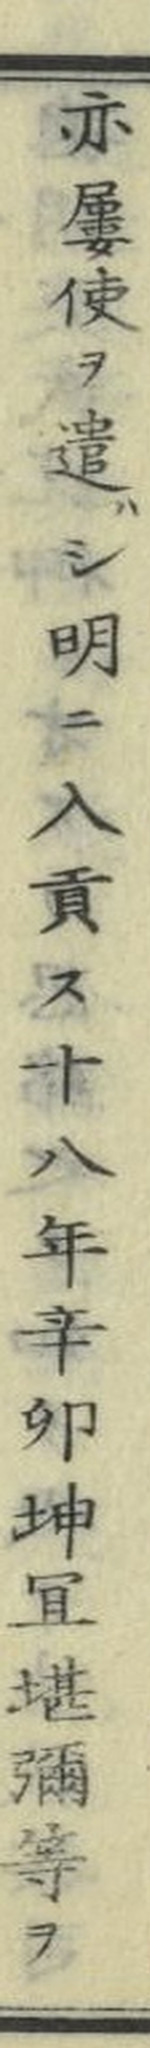亦屢使ヲ遣シ明ニ入貢ス十八年辛卯坤湛彌等ヲ
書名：琉球藩史 一之巻
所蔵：University of the Ryukyus Library
